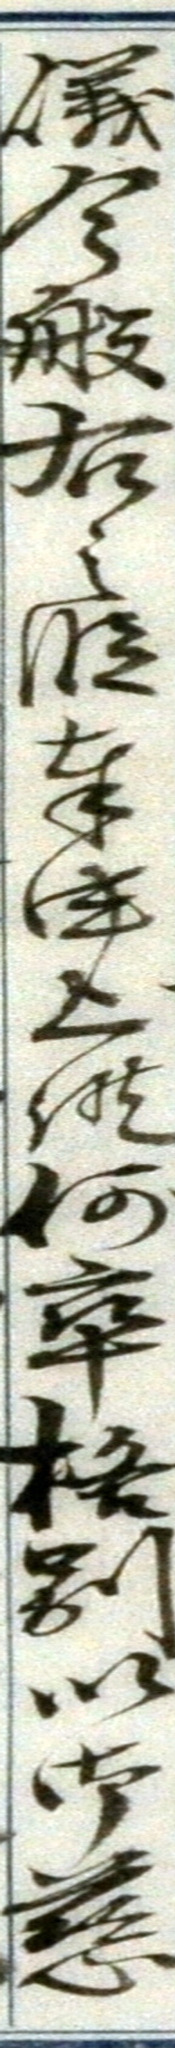儀今般右之段奉申上候何卒格別以御慈
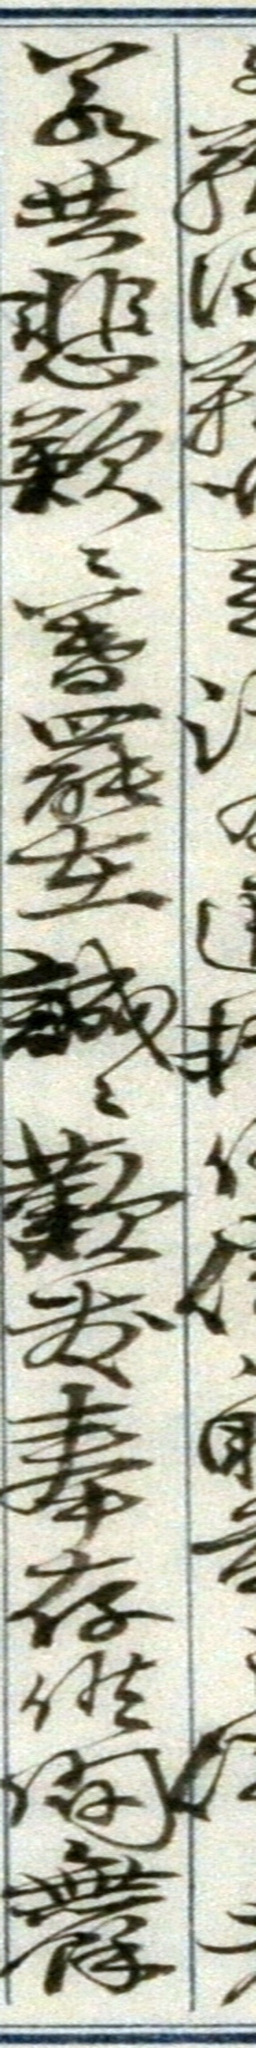若共悲歎ニ暮罷在誠ニ歎敷奉存候間無余
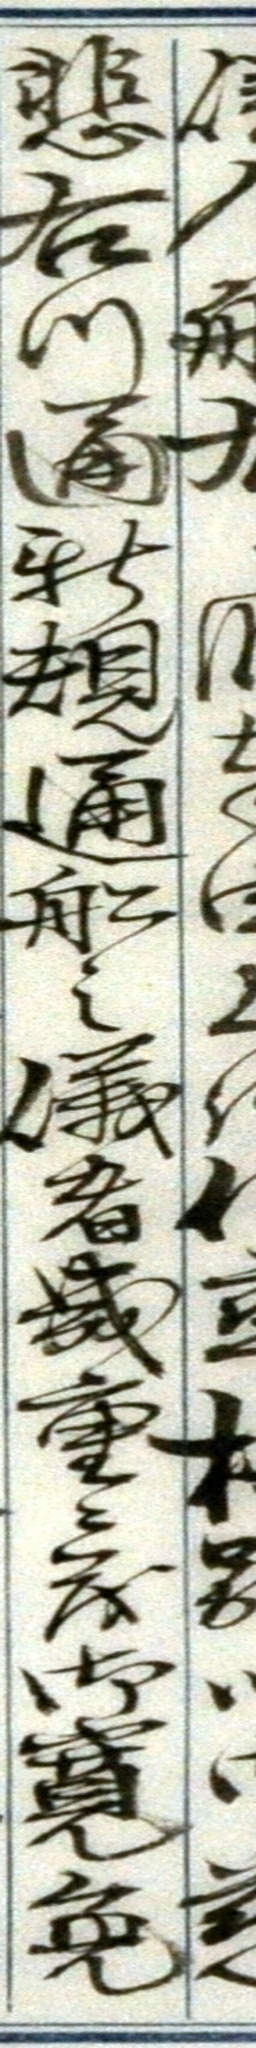悲右川通新規通船之儀者幾重ニも御寛免
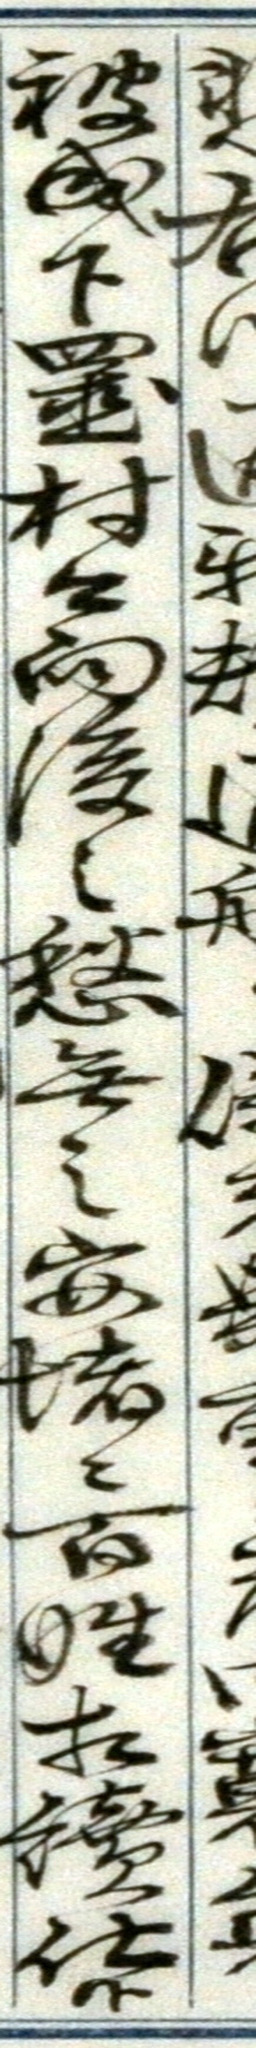被成下置村々向後之愁無之安堵と百姓相続仕候
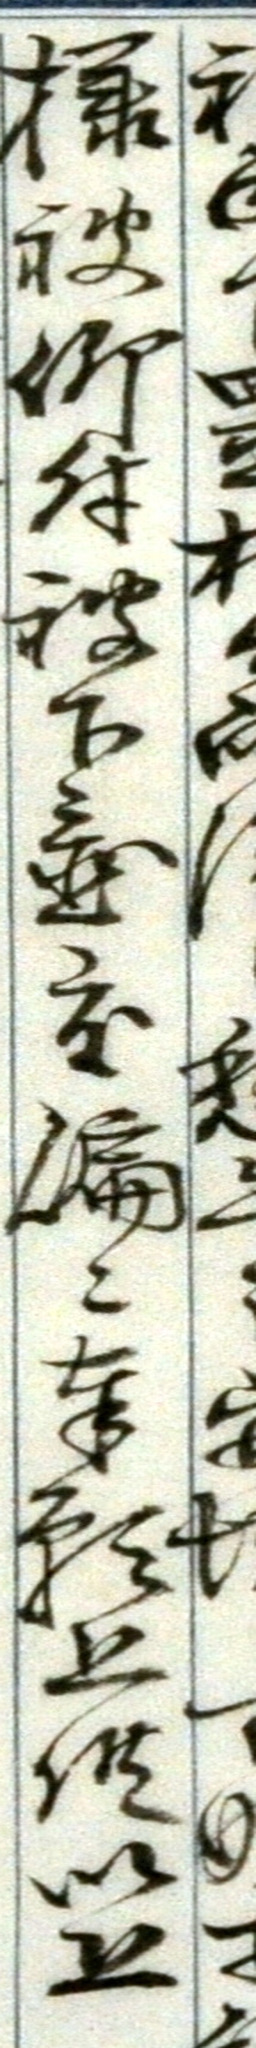様被仰付被下置度偏ニ奉願上候以上
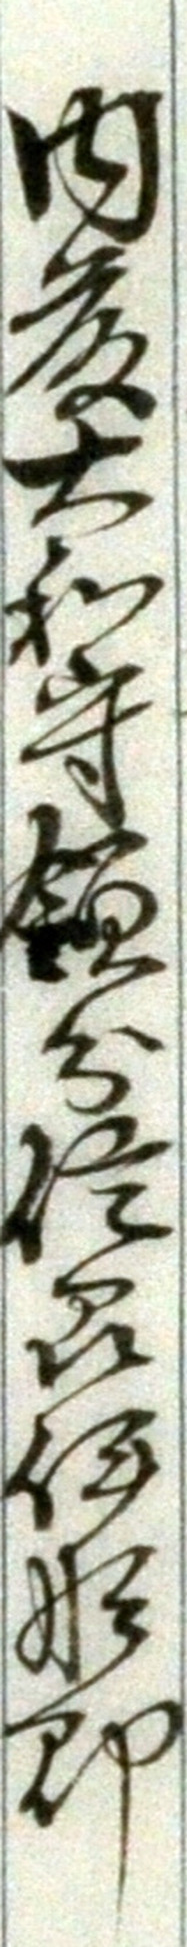内藤大和守領分信州伊奈郡
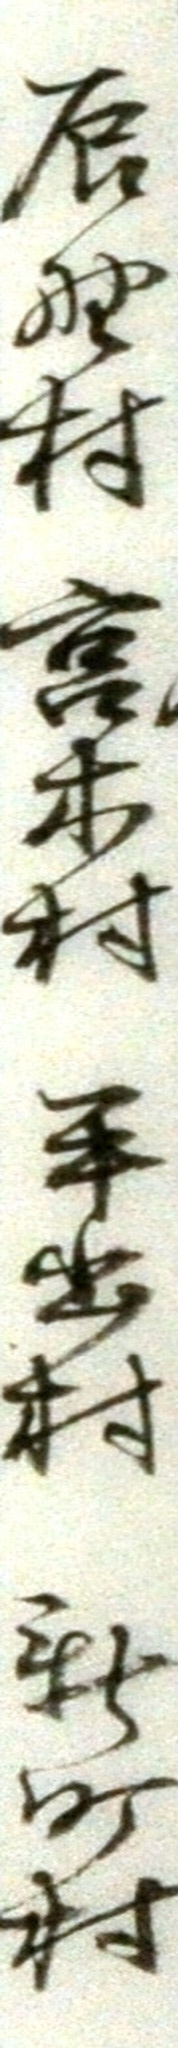辰野村宮木村平出村新町村
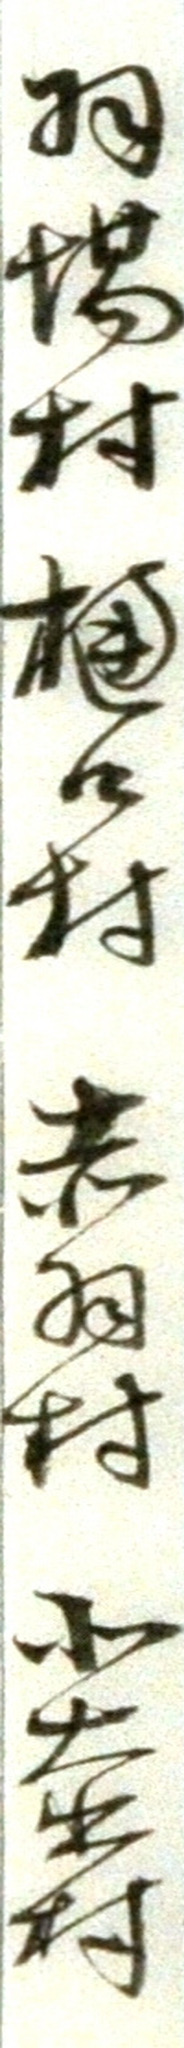羽場村樋口村赤羽村北大出村

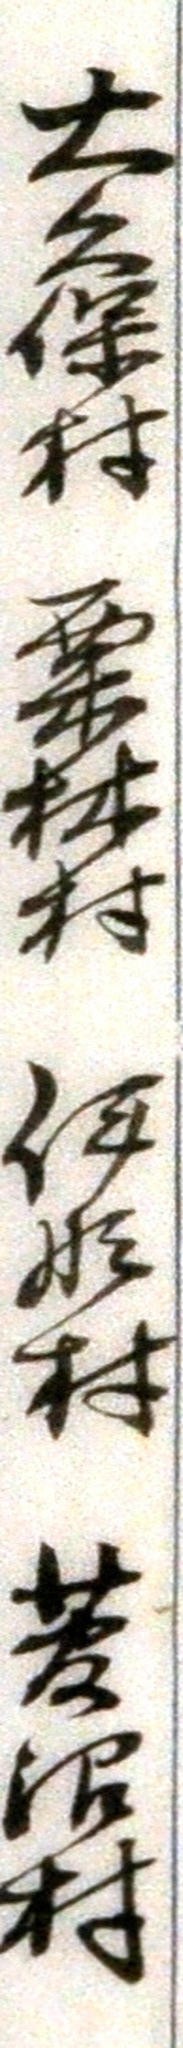大久保村栗林村伊奈村菅沼村
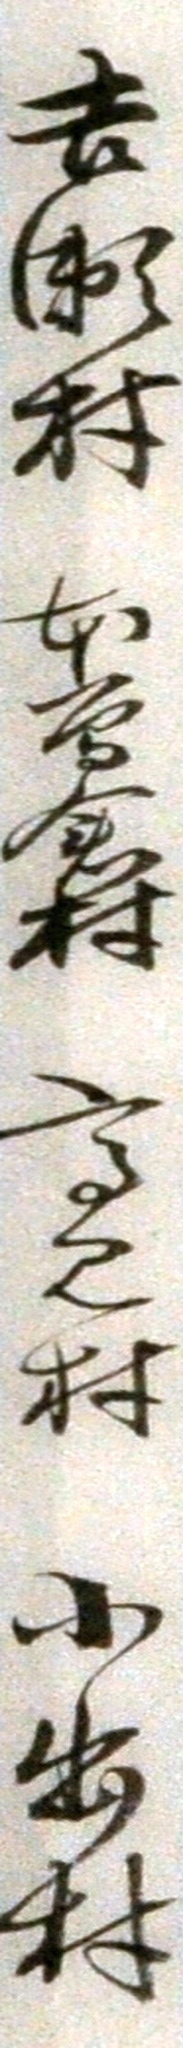吉瀬村本曾倉村高見村小出村
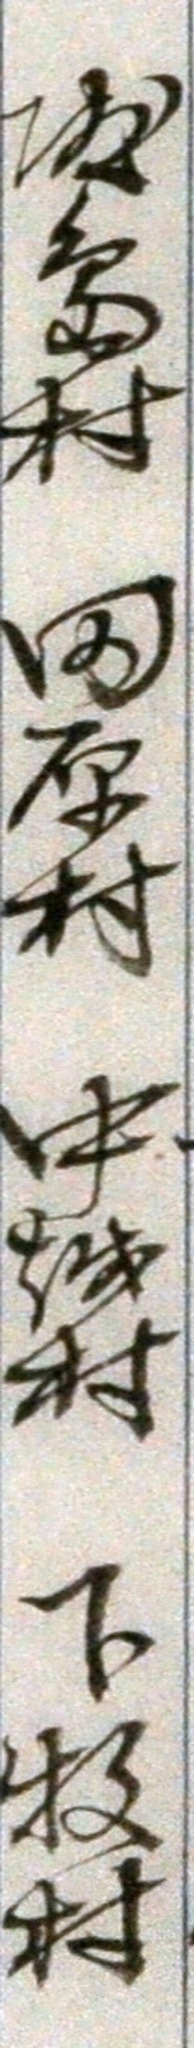渡島村田原村中越村下牧村
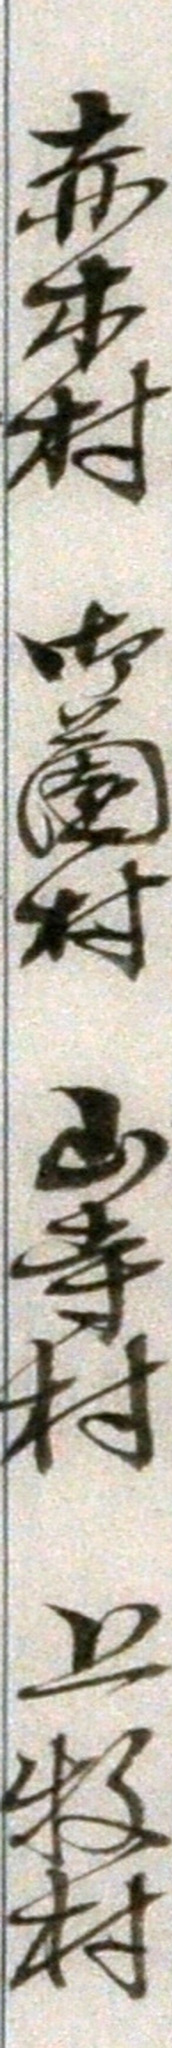赤木村御園村山寺村上牧村
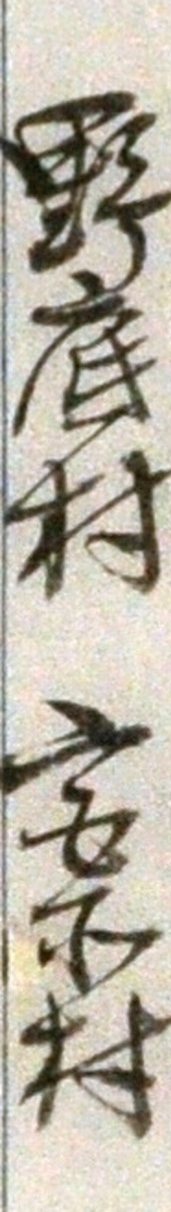野底村宮所村
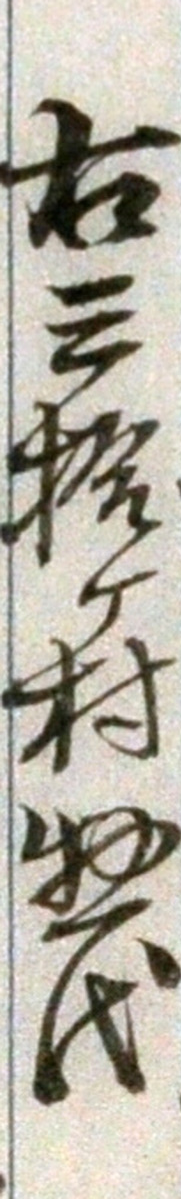右三拾ヶ村惣代
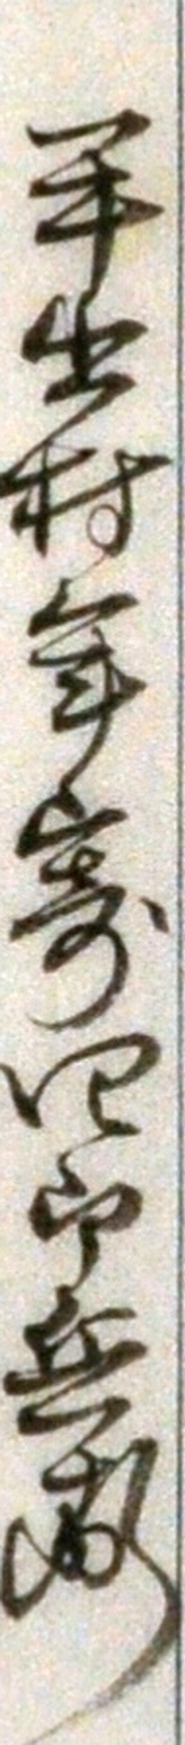平出村年寄四郎兵衛其他
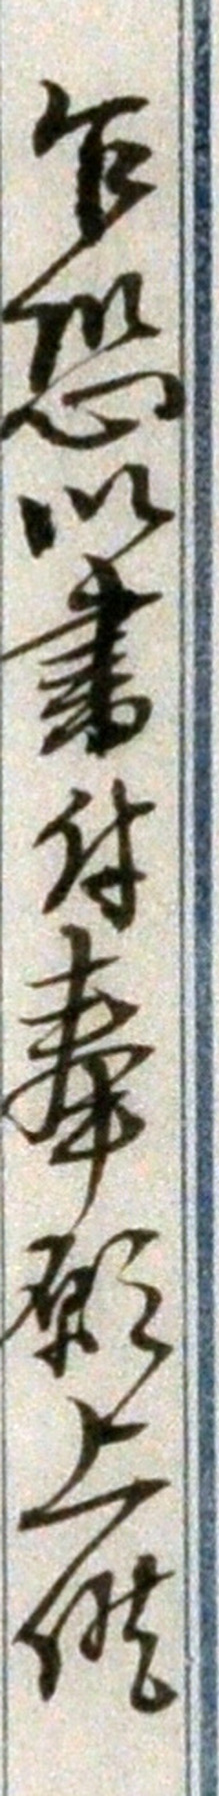乍恐以書付奉願上候
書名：天竜川通船難渋願并取極書
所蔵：伊那市立高遠町図書館・合同会社AMANE
